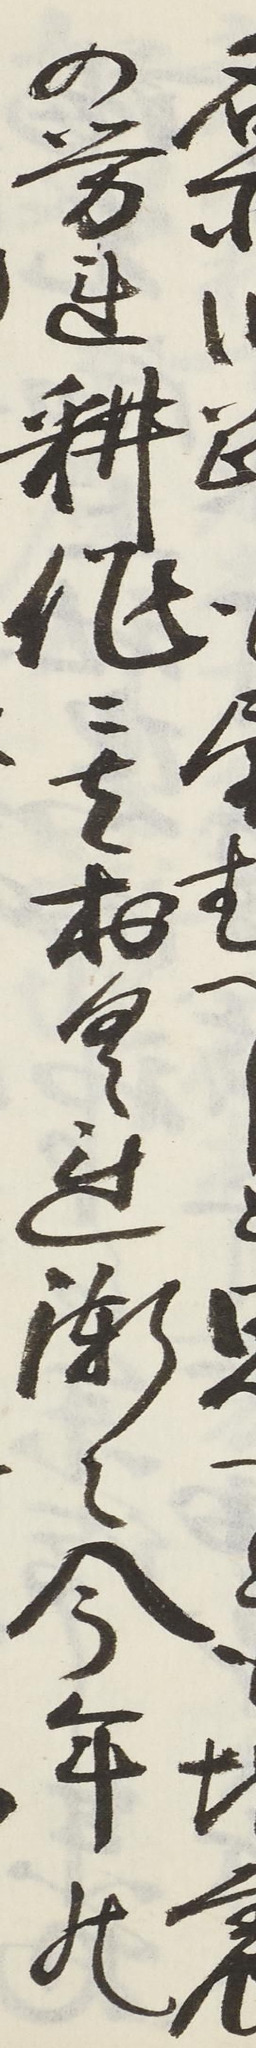の労れ耕作二はおくれ漸々今年の
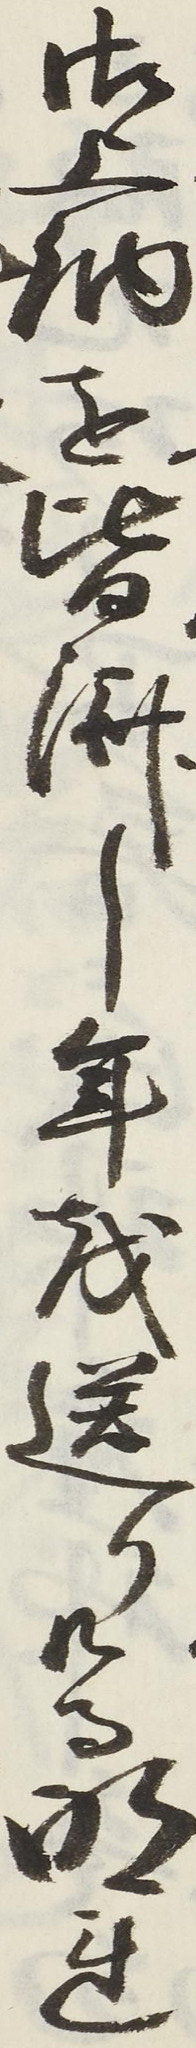御上納を皆済し年を送りける明れ
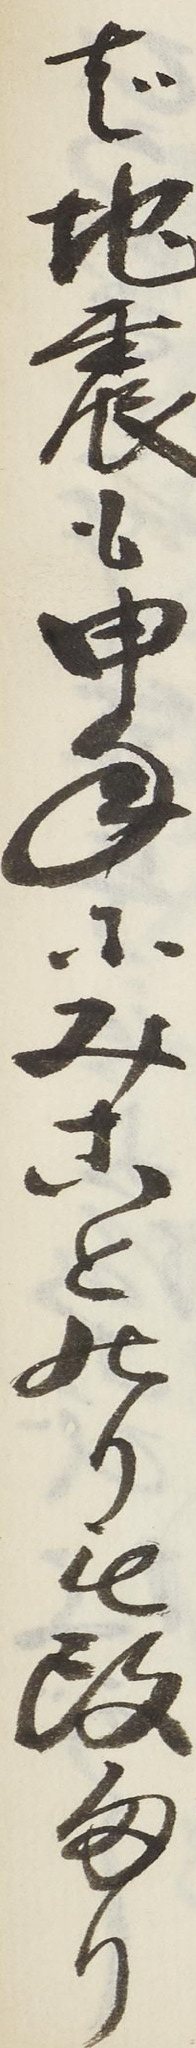ば地震も申年にみことのりも改まり

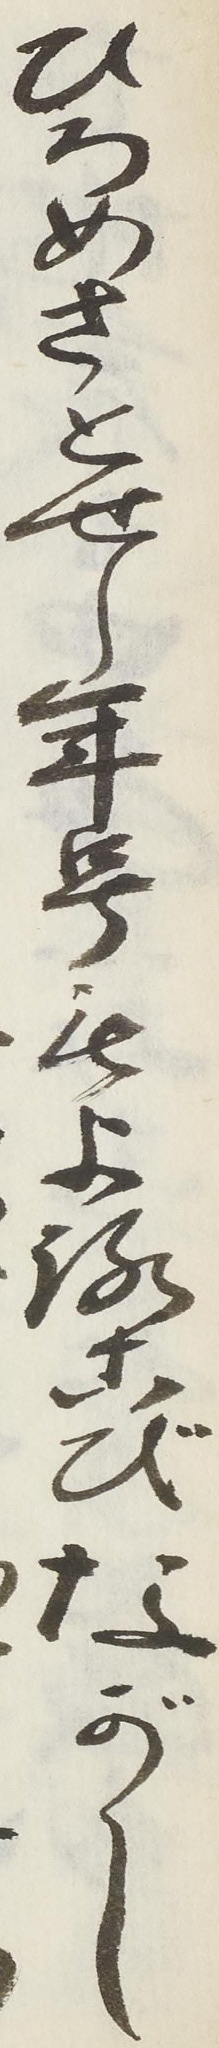ひろめさとせし年号もよろこびながし
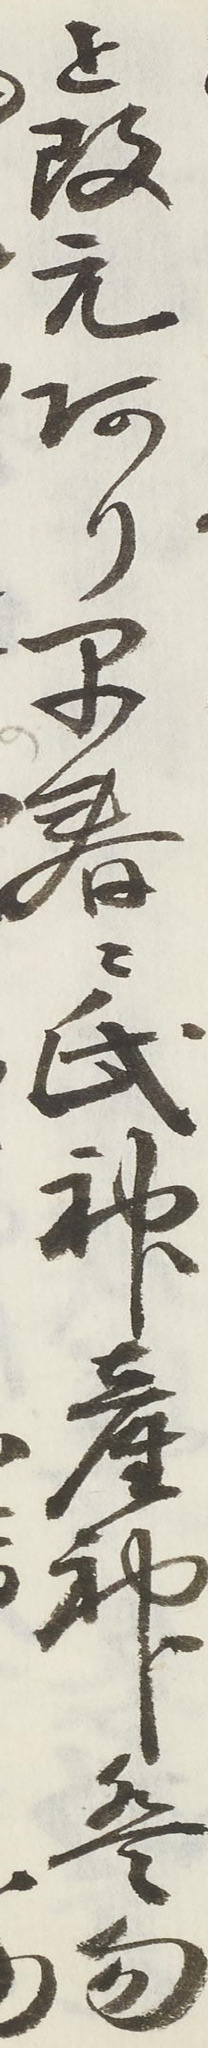を改元あり早春二氏神産神は勿
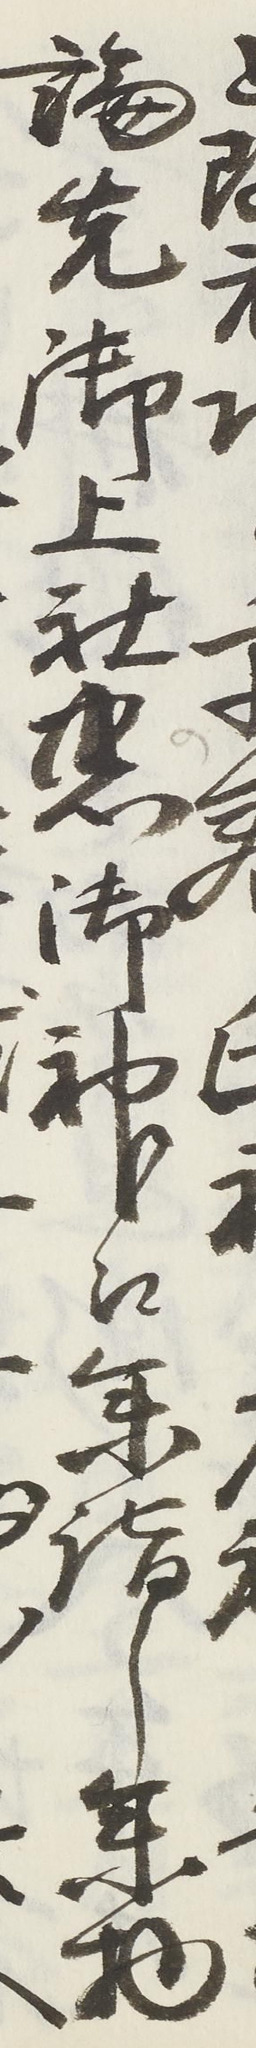論先御上の御神江参詣参物
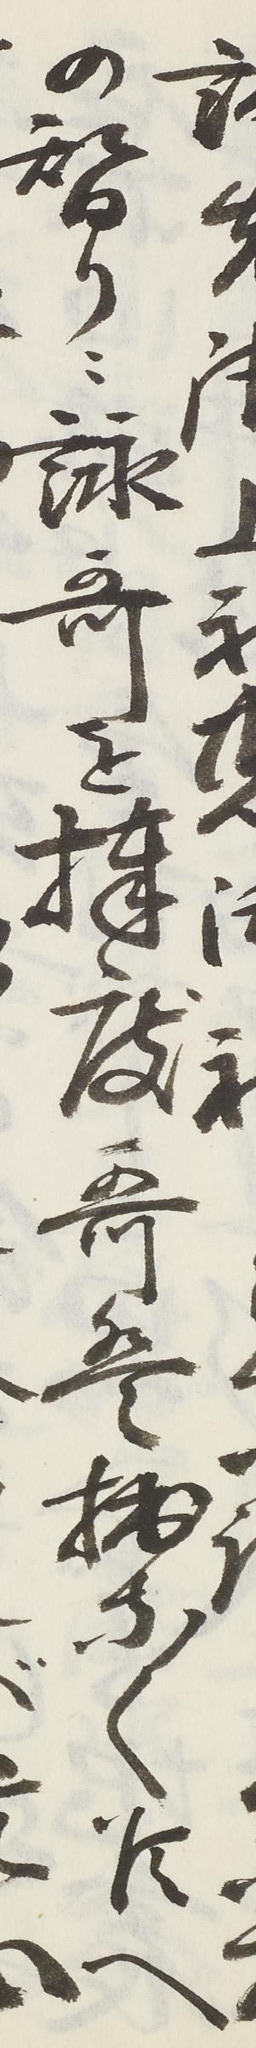の智り二詠哥を捧度哥は拙なく候へ
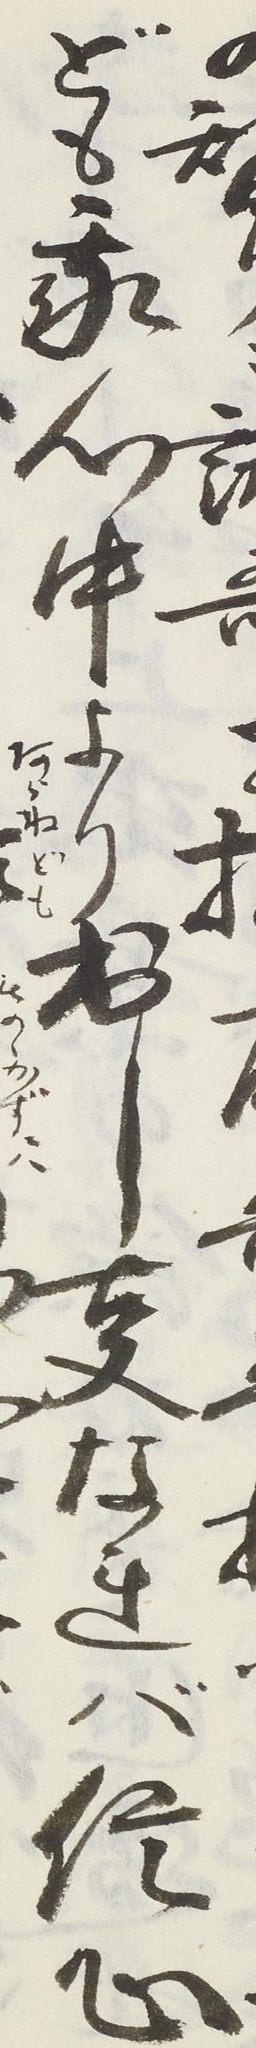ども我心中より出し事なれバ信心
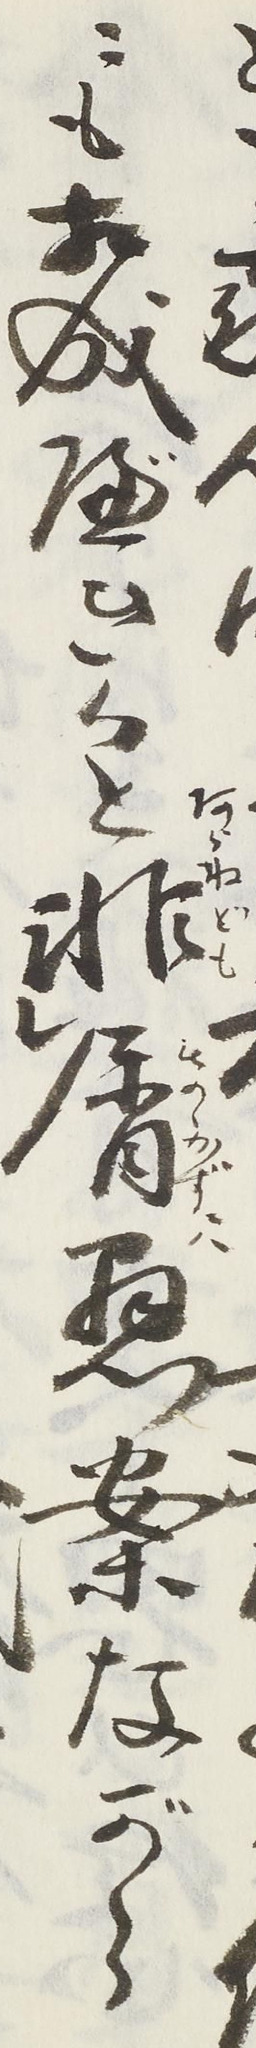二も相成べきかと非屑思案ながら
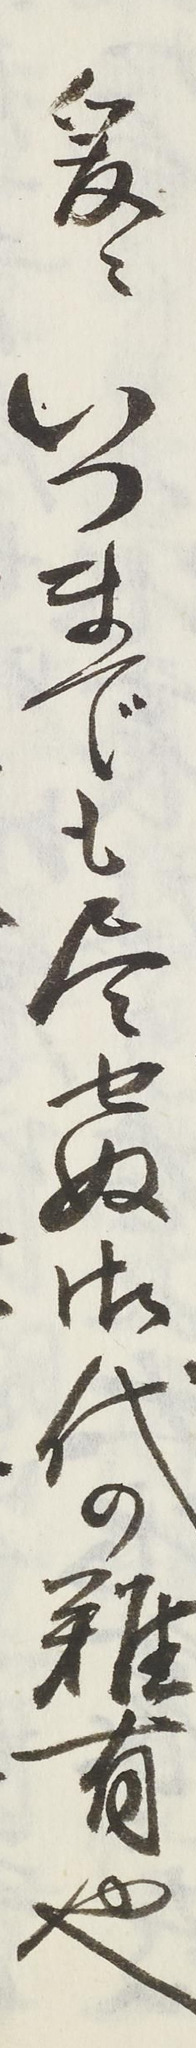爰二いつまでも尽せぬ御代の難有や
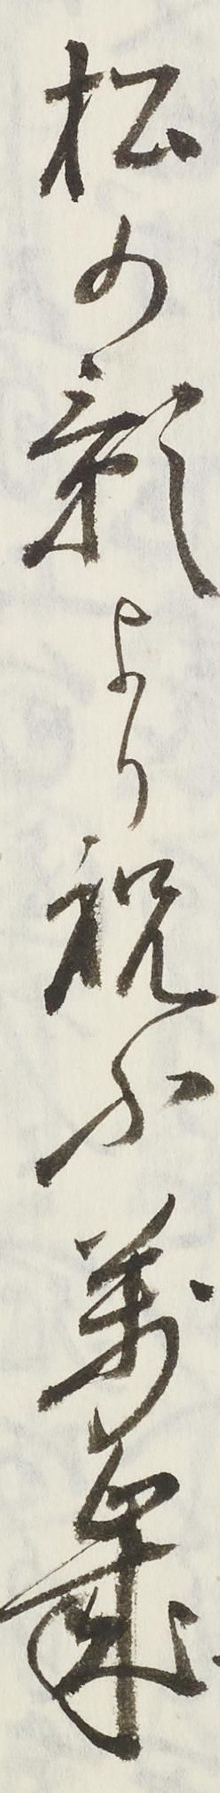松の願より祝ふ萬歳
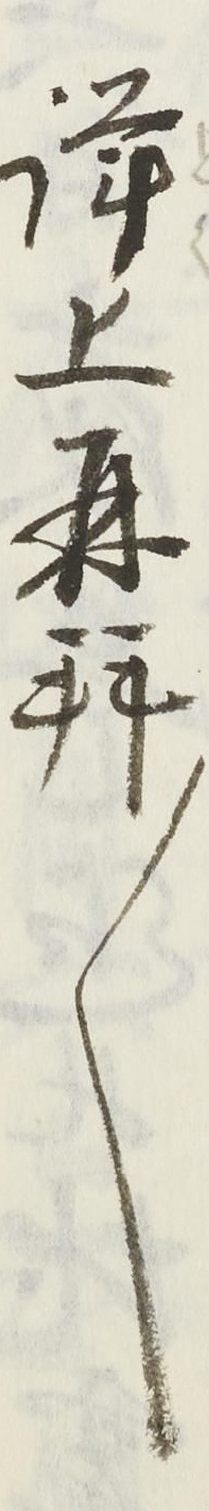読上再拝〳〵
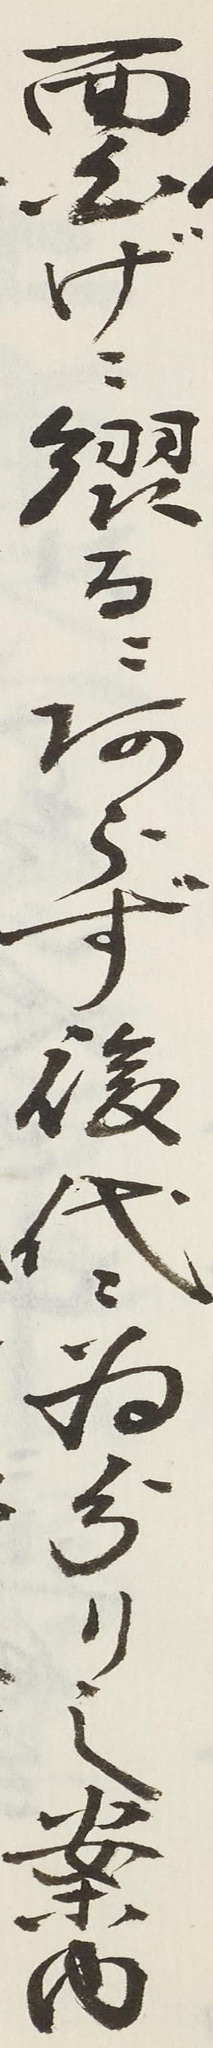面白げ二躍る二あらず後代二為分り之案内
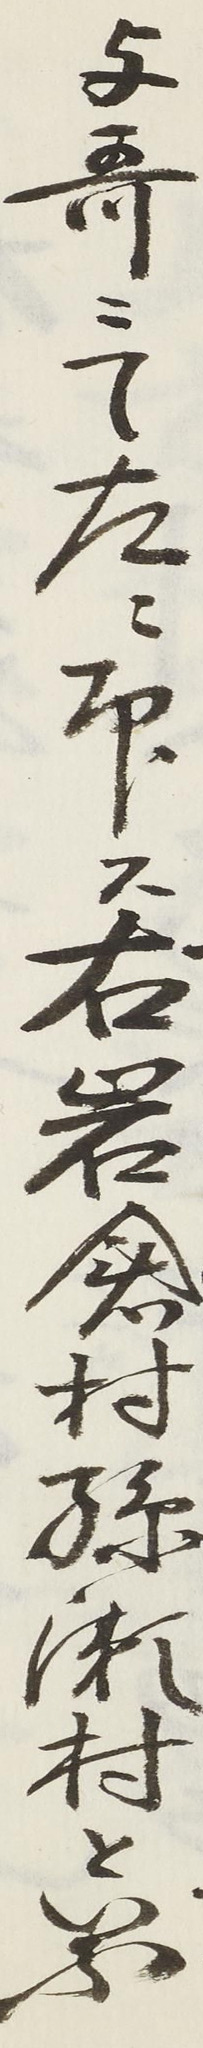と哥二て左二印ㇲ右岩倉村孫瀬村といふ
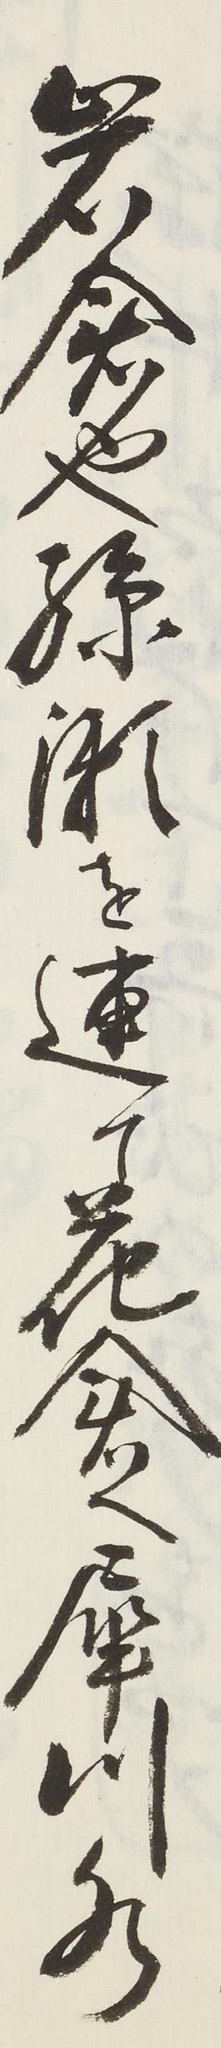岩倉や孫瀬を連て花倉へ犀川水
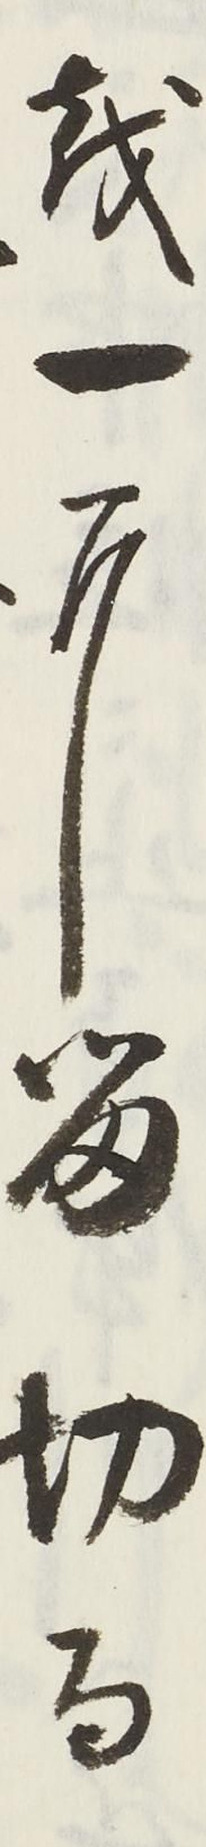を一に留切る
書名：弘化四年地震記
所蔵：東京大学地震研究所図書室 Earthquake Research Institute Library, The University of Tokyo, JAPAN
